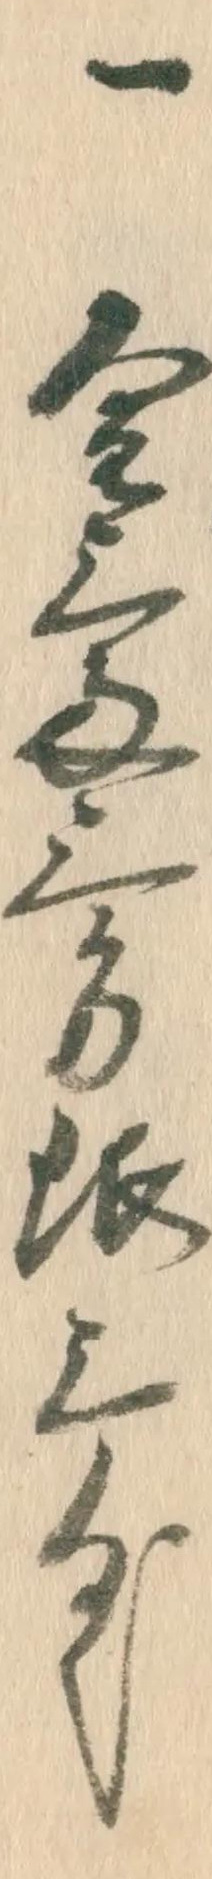一金三両三分銀三匁

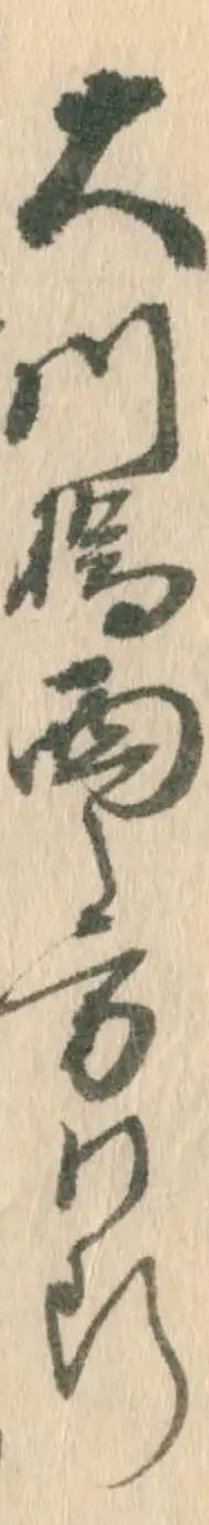大川橋西之方同断
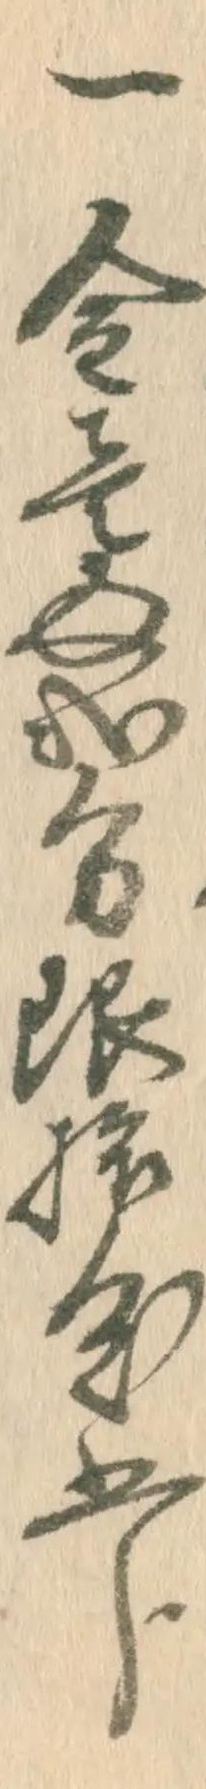一金壱両弐分銀拾匁五分
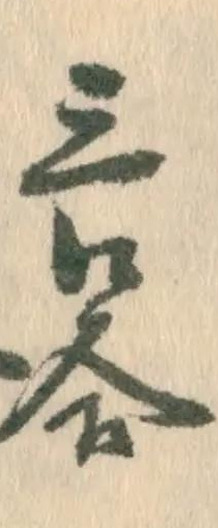三口合
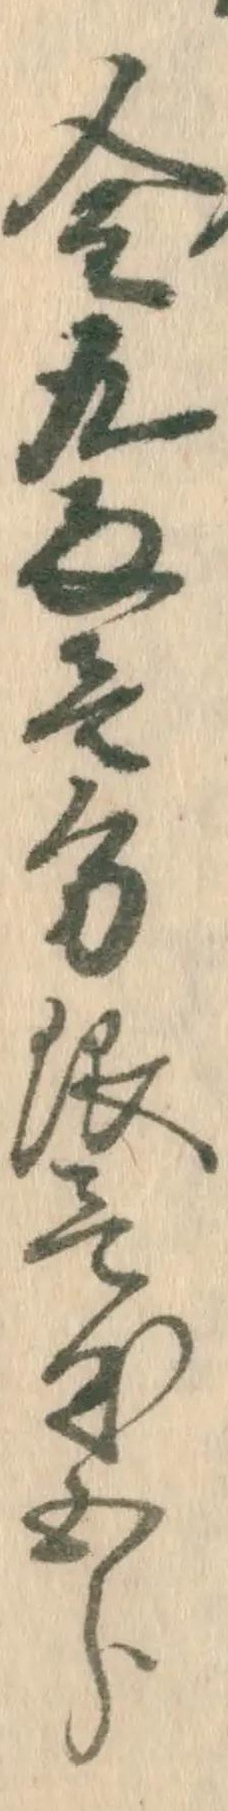金九両壱分銀壱匁五分
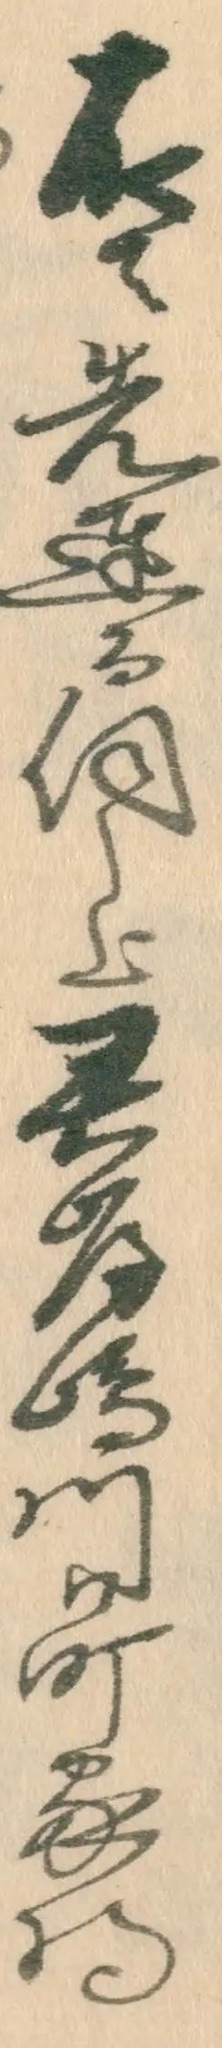右は先達而伺之上霊岸島川口町家持
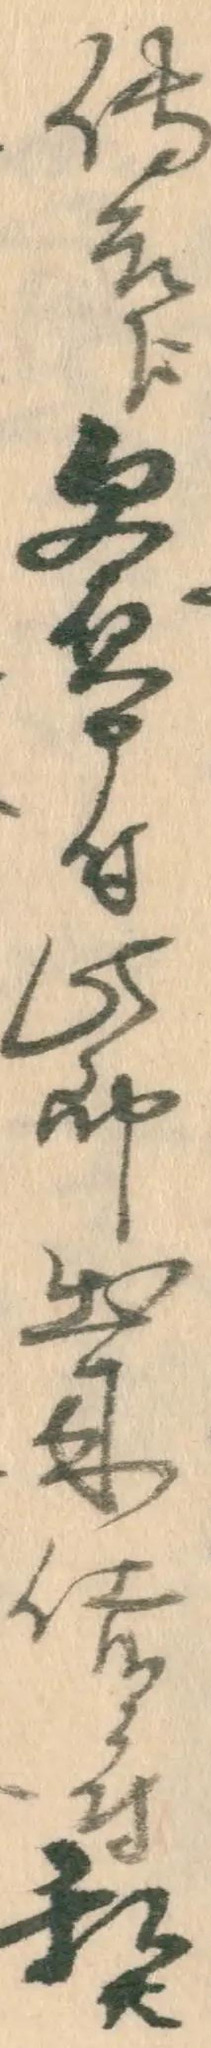伝吉え受負申付此節出来仕候ニ付私共
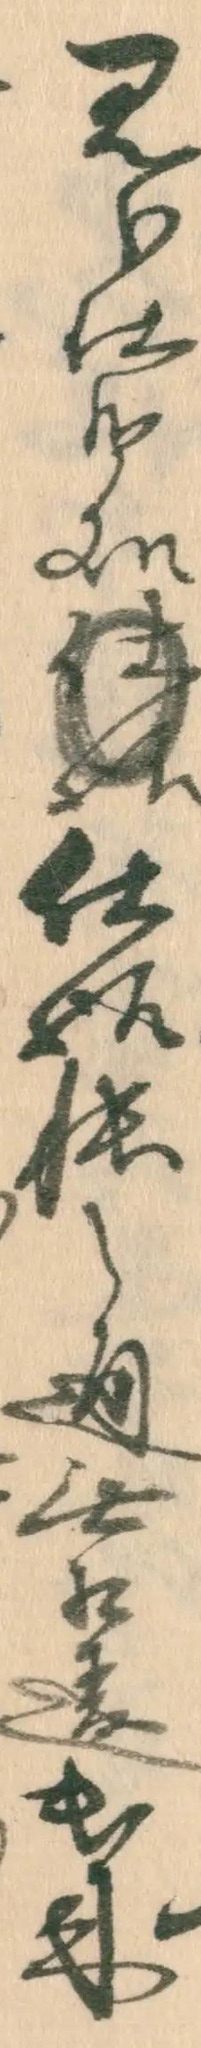見分仕候処「仕様」仕様帳之通無相違出来
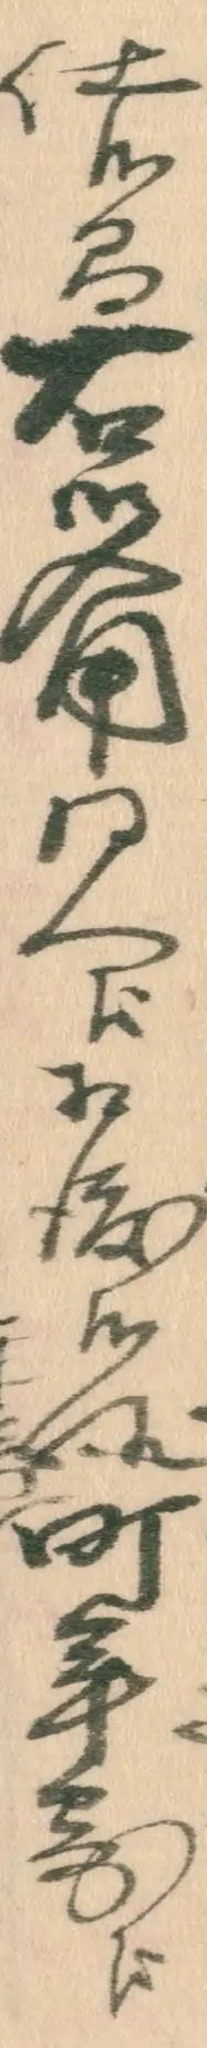仕候間右御入用同人え相渡候様町年寄え
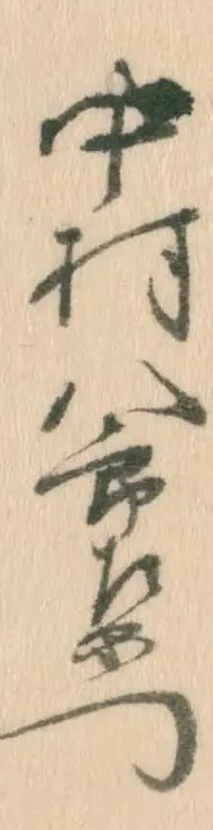中村八郎左衛門

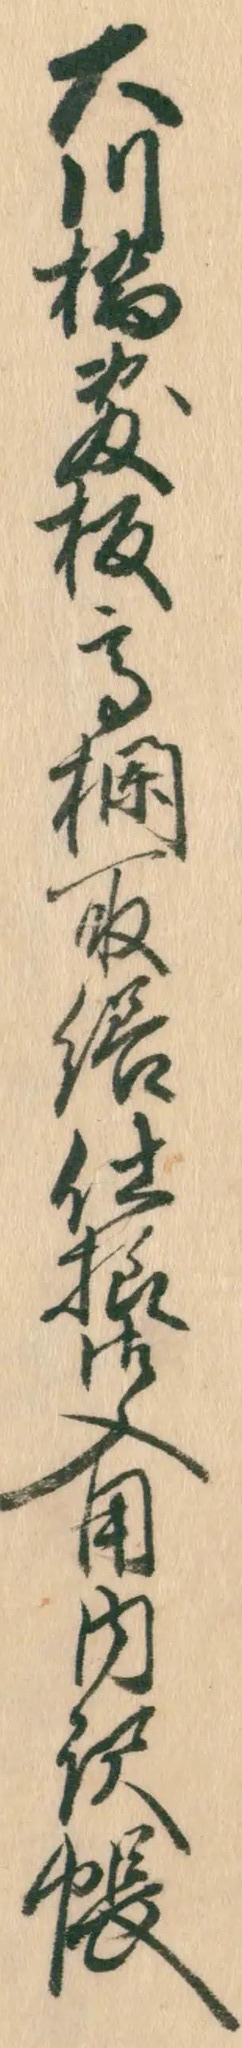大川橋敷板高欄取繕仕様御入用内訳帳

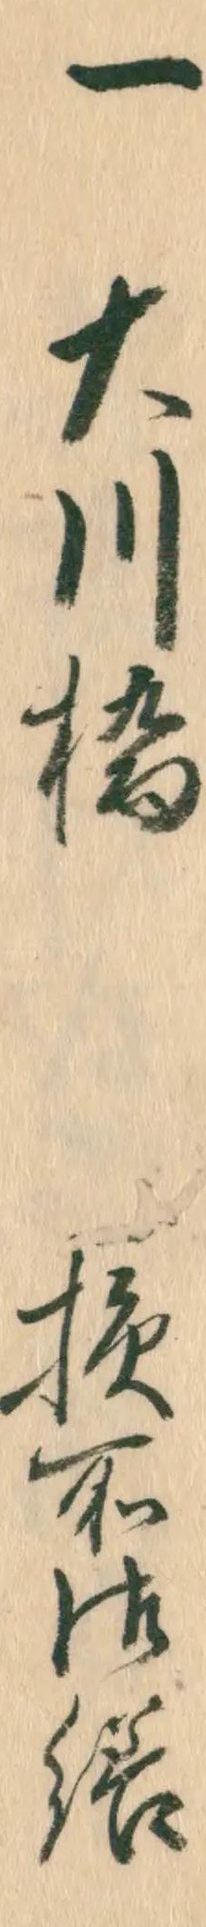一大川橋損所御繕
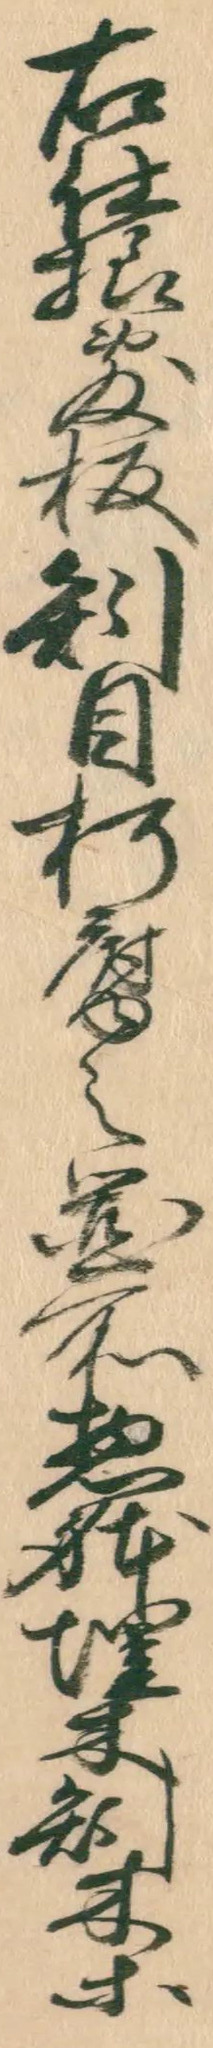右仕様敷板矧目朽腐之箇所惣体埋木矧木等
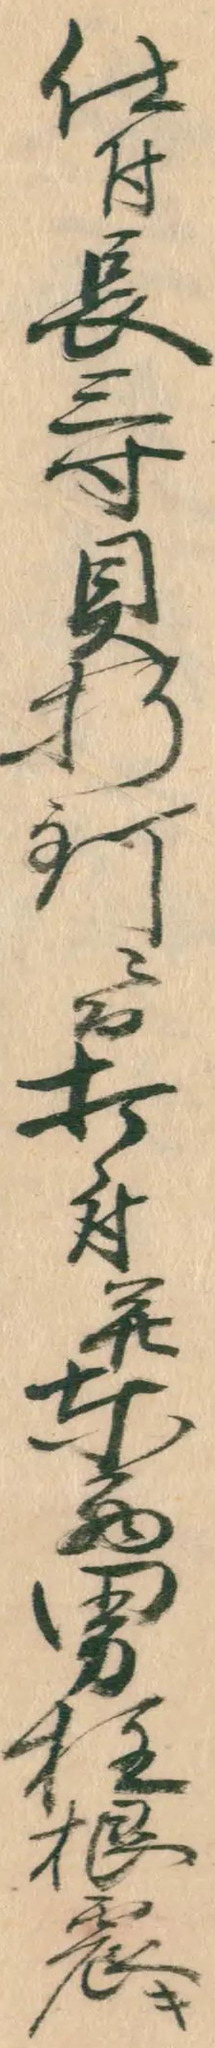仕付長三寸貝折釘ニ而打付并東西男柱根震キ
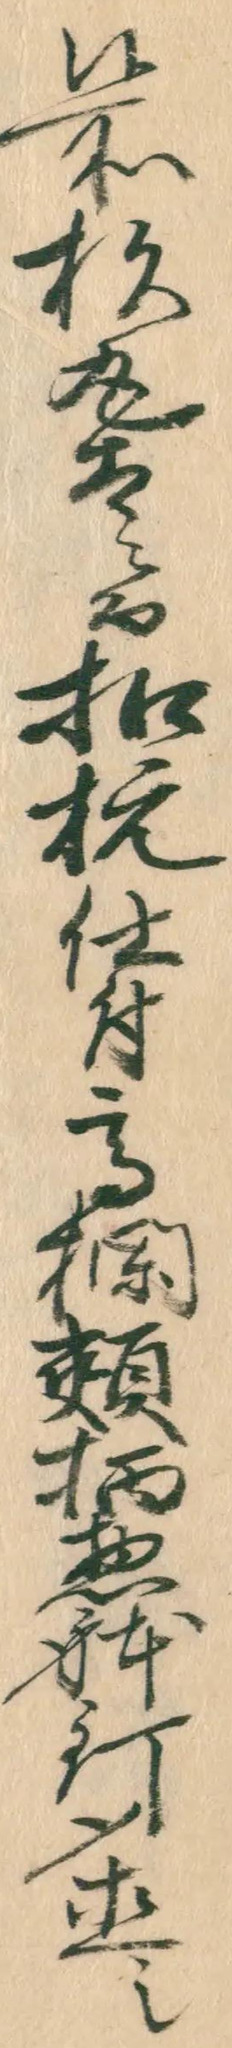候所杉丸太ニ而扣杭仕付高欄頬柄惣体釘〆直し
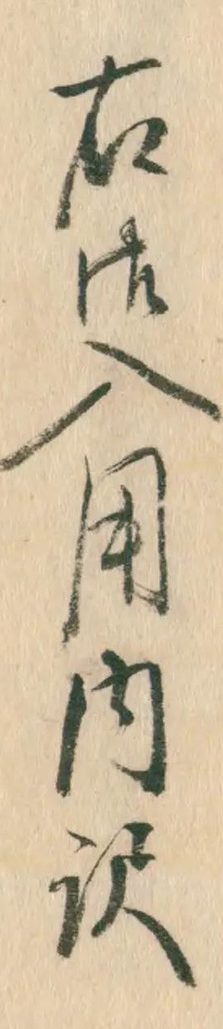右御入用内訳
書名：三橋 17巻. [8] 三橋小破御修復書留　但御奉行御掛リ替地震潰橋番屋　嘉永四亥年より安政二卯年迄　下
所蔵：国立国会図書館 National Diet Library, JAPAN
